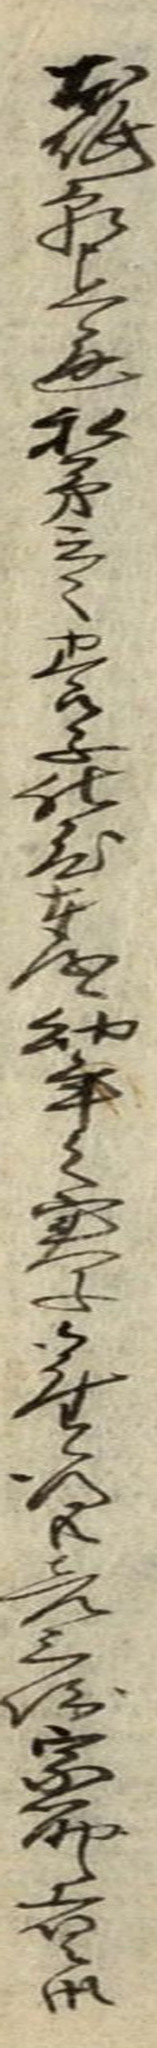本紙願申上候通私弟云々養子仕度奉存候幼年之実子御座候得共彦兵衛家筋之者ニ御
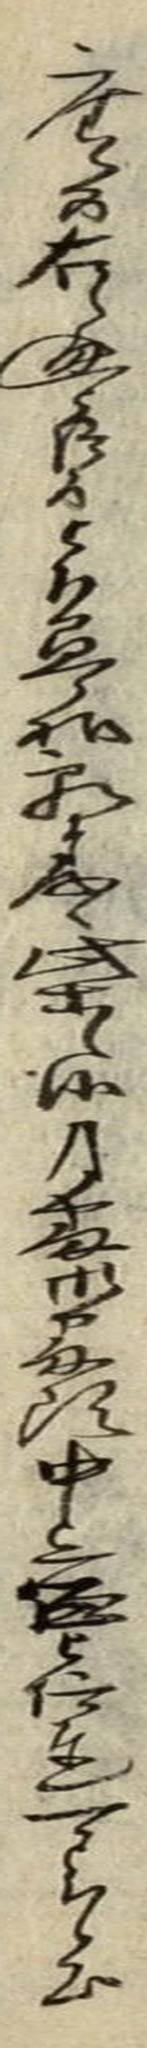座候間右之通被仰付被下置候様願奉存候此等之趣月番御番頭中迄宜被仰達可被下候已上
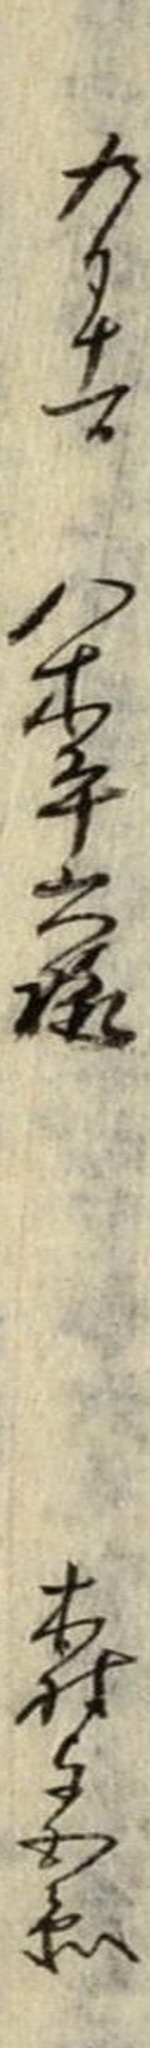九月十一日八木平六殿木村与五兵衛
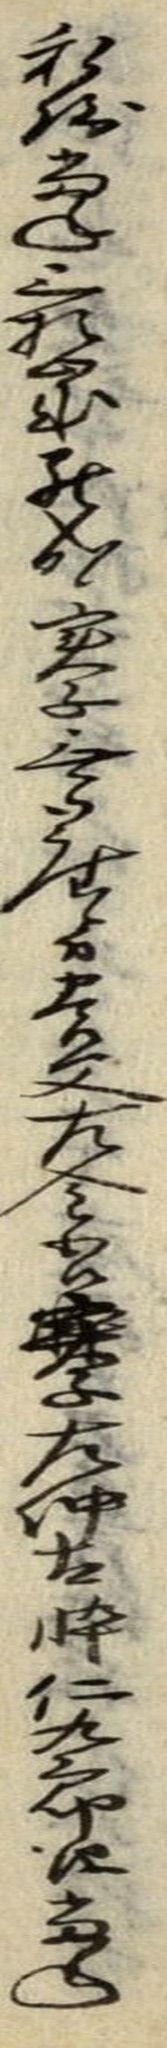私儀当年三拾歳罷成候実子無御座候ニ付養父左金吾実子左仲太忰仁九郎儀当年
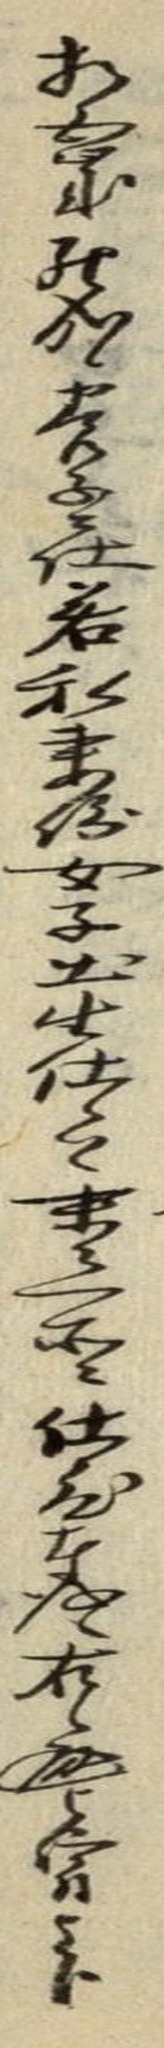拾五歳罷成候養子ニ仕若私妻儀女子出生仕候ハヽ末々一所ニ仕度奉存候右之通被仰付被下
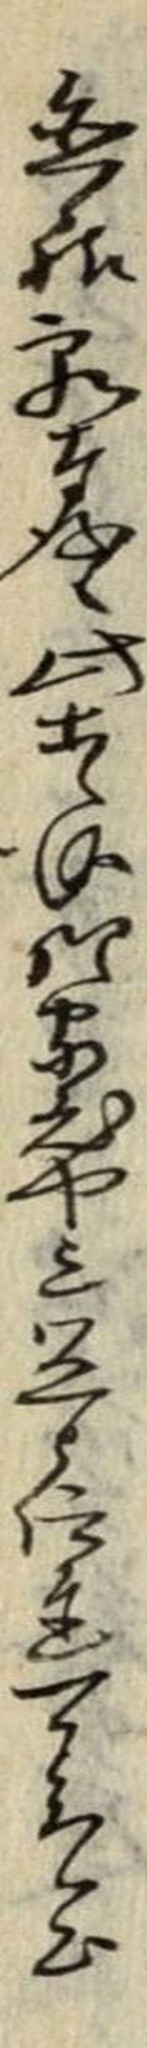置候様願奉存候此等之趣御家老中迄宜被仰達可被下候已上
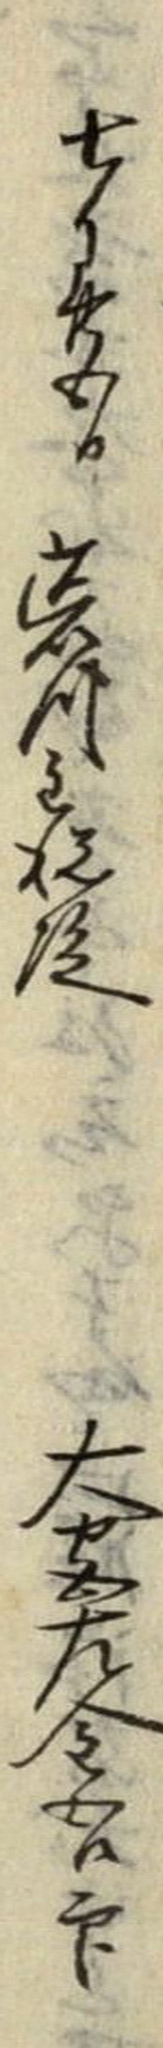七月廿五日荒川主税殿大宮左金吾印
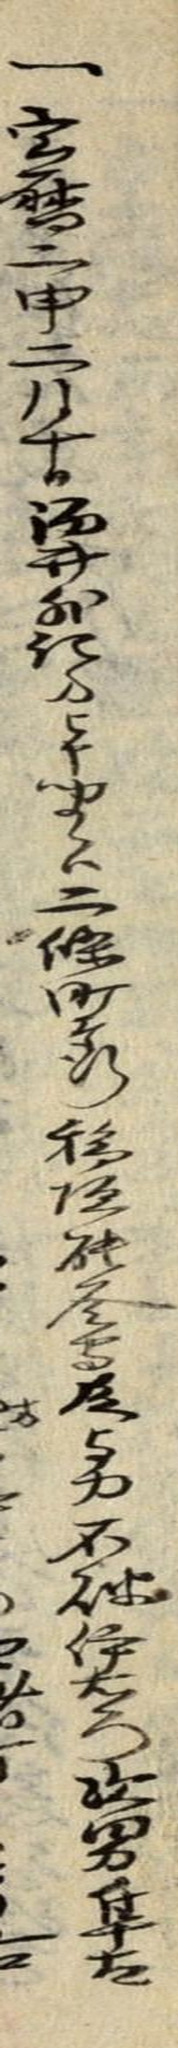一宝暦二申二月十日酒井外記方被申聞候ハ二条町奉行稲垣能登守殿与力不破伊右衛門次男隼太
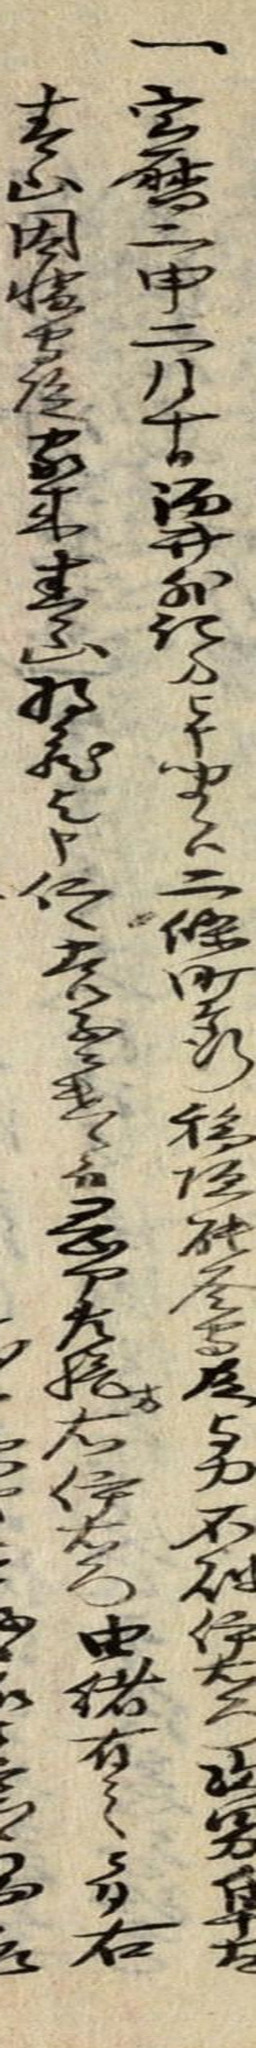青山因幡守殿家来青山将蔵与申仁へ養子ニ遣候ニ付岡部左膳方右伊右衛門由緒有之候ニ付右
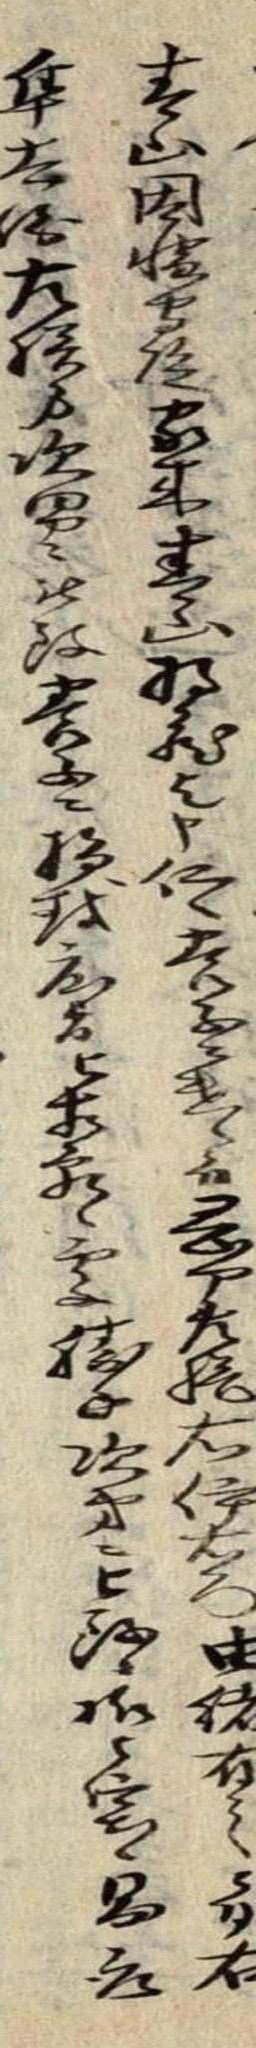隼太儀左膳方次男ニ被致養子ニ指越度旨被相願候処勝手次第ニ被致候様被仰出候則取
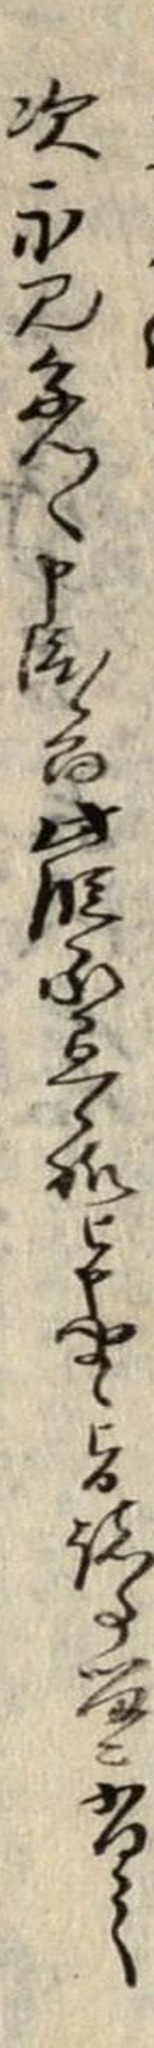次永見多門へ申渡候間此段承置候様被申聞候旨諸事留ニ有之
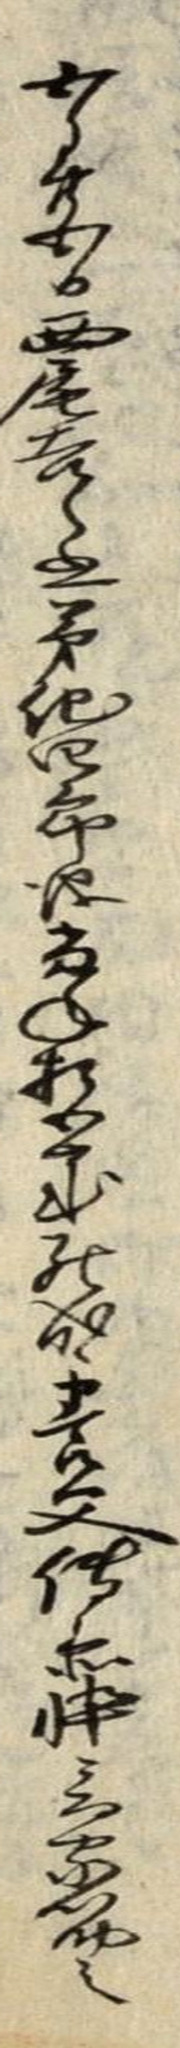一五月廿五日西尾吉之丞弟他四郎儀当年拾五歳罷成候養父伝兵衛忰ニ而家筋之
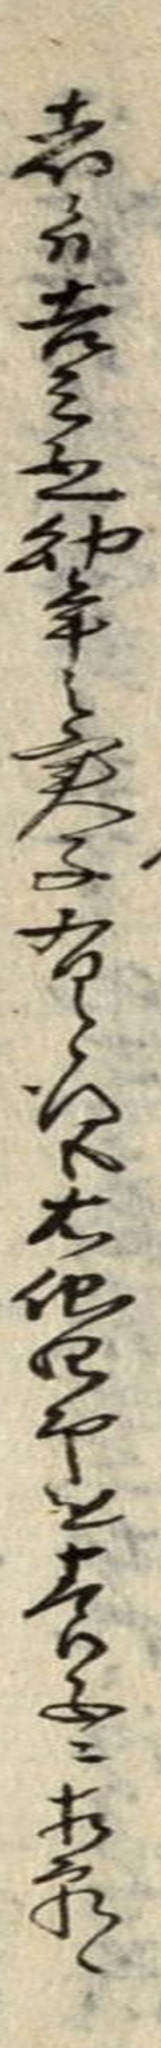者ニ付吉之丞幼年之実子有之候得共右他四郎を養子ニ相願候
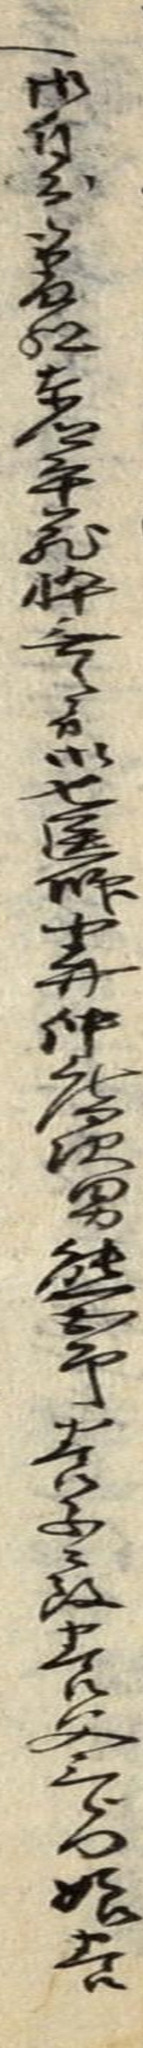御付分御番組東郷平蔵忰無之ニ付御匕医師半井仲庵次男熊五郎養子ニ致養父三郎右衛門娘養
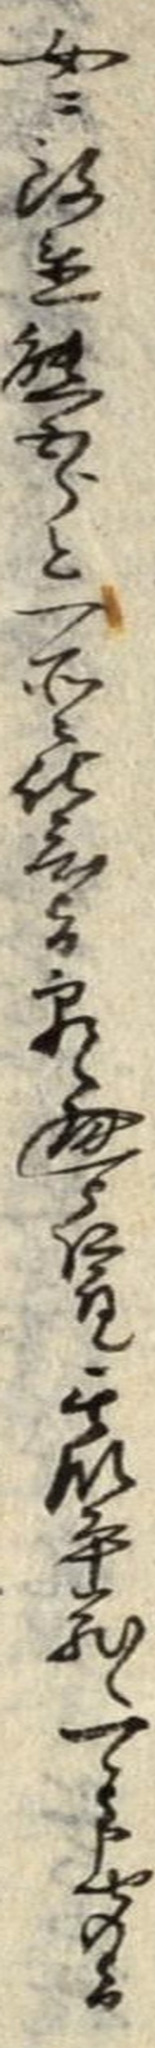女ニ致置熊五郎と一所ニ仕度旨願之通被仰付候其段平蔵へ可被申聞候
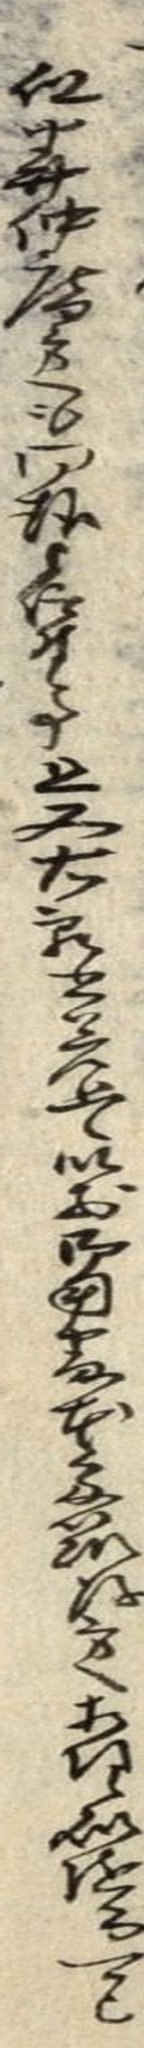但半井仲庵へも同趣被仰付候事且又右願書差上候以前御用番本多筑後方へ相伺候処随分可被
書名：養子縁組之部
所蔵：福井県文書館 Fukui Prefectural Archives
